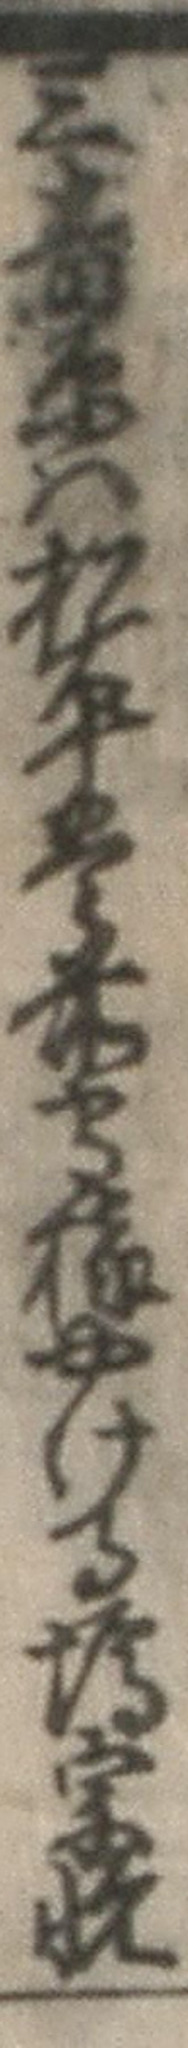三番原は松平豊前守様やける塙宗悦
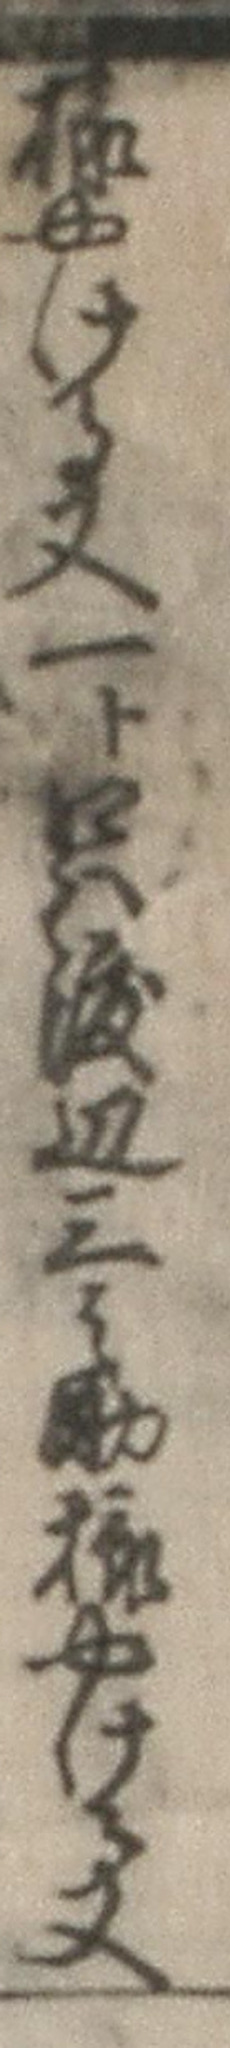様やける又一ト口は渡辺三之助様やける又
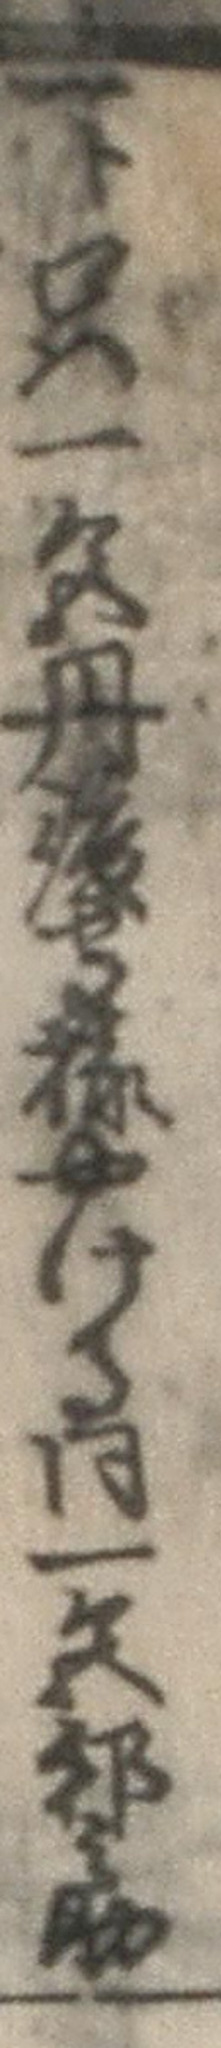一ト口は一色丹後守様やける同一色邦之助
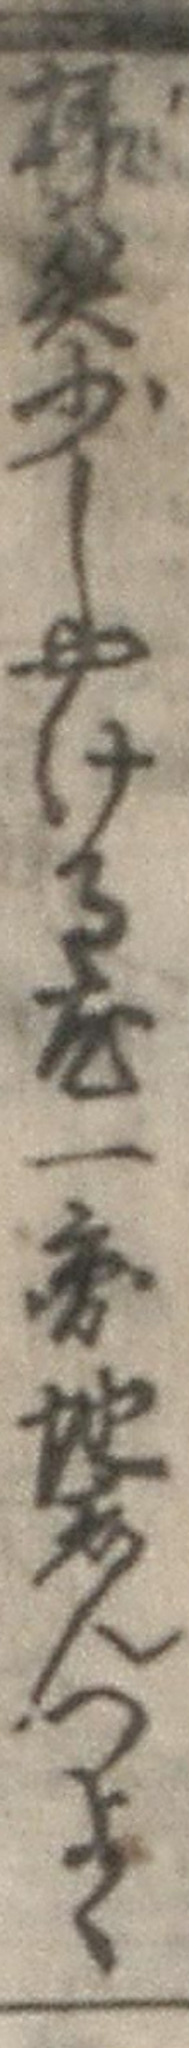様奥少しやける尤一円地しんつよく
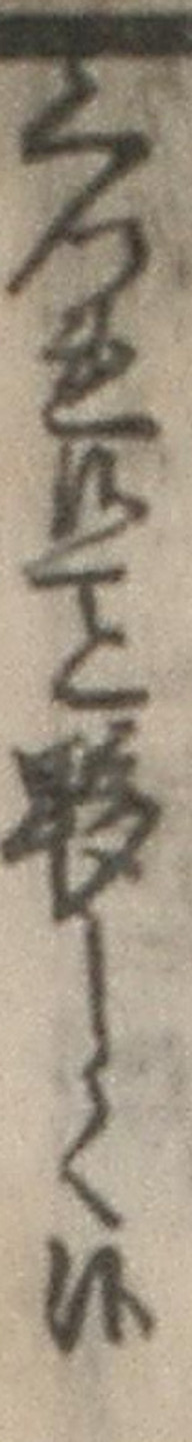くつれ候こと夥して候
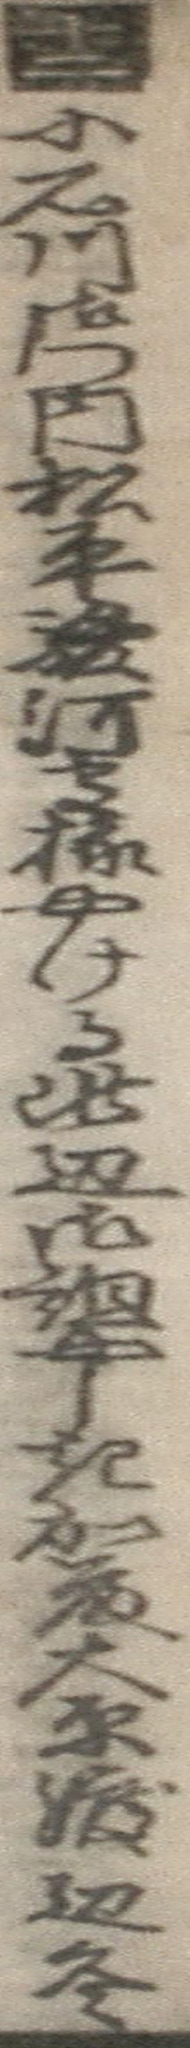十二小石川御門内松平駿河守様やける此辺御組やしき加藤大原渡辺冬
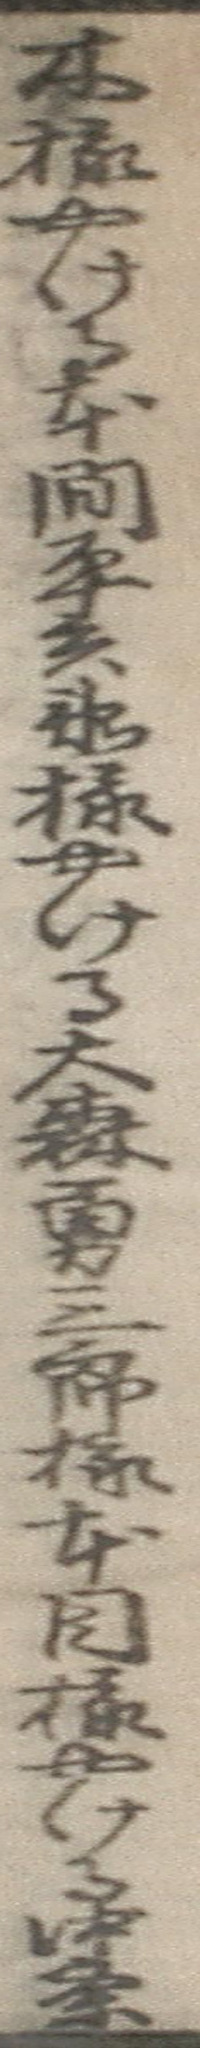木様やける本間平兵衛様やける大森勇三郎様本目様やける中条
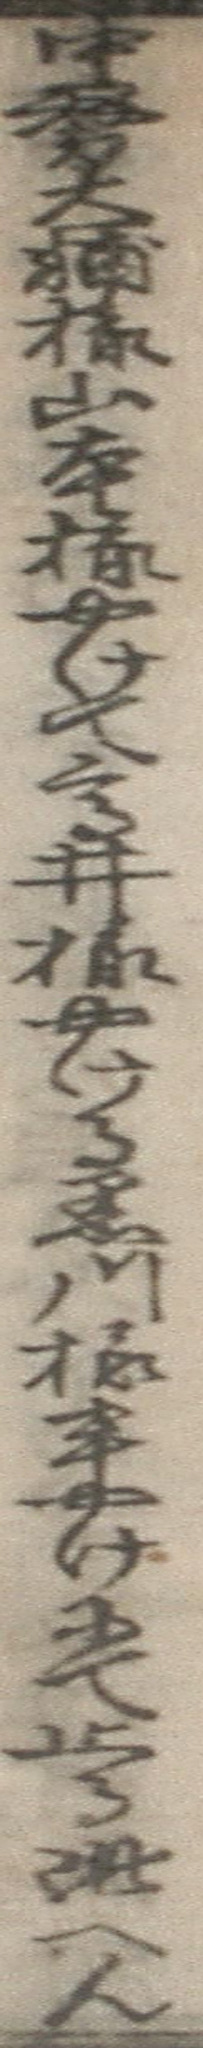中勢大輔様山本様やけて高井様やける黒川様半やけにて止る此へん
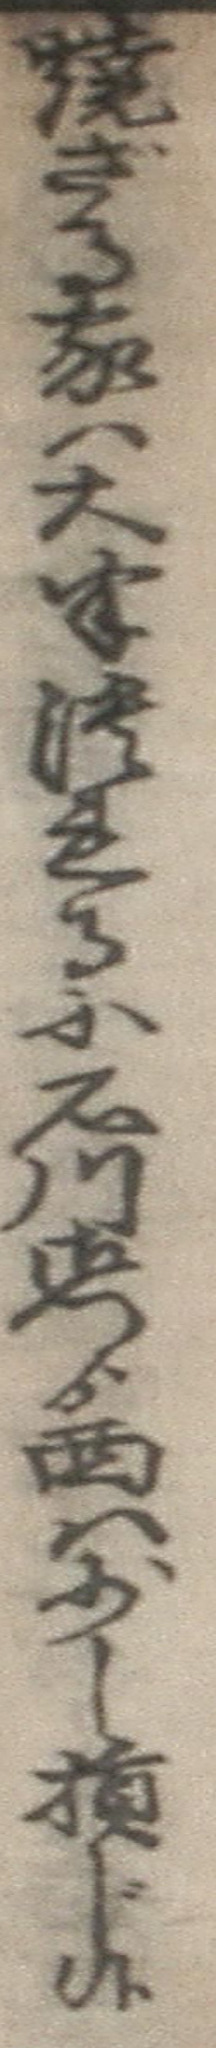焼ざる家は大半潰れる小石川御門ゟ西は少しっ損じ候
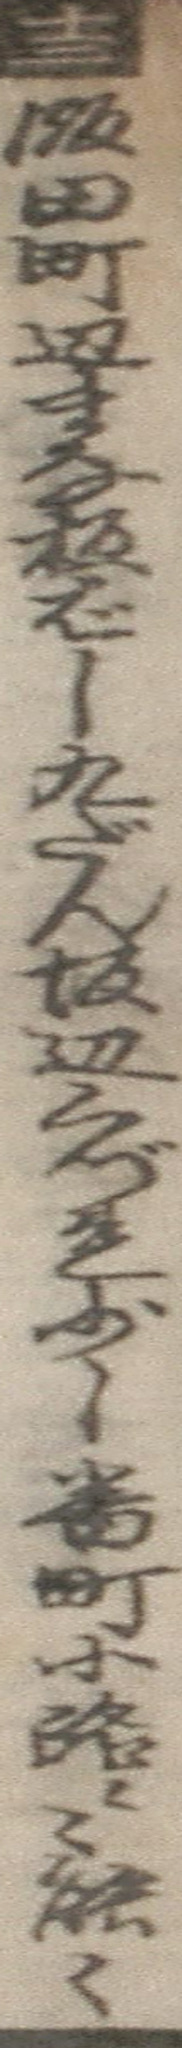十三飯田町辺まな板ばし九だん坂辺くづれ少し番町小路にて能く
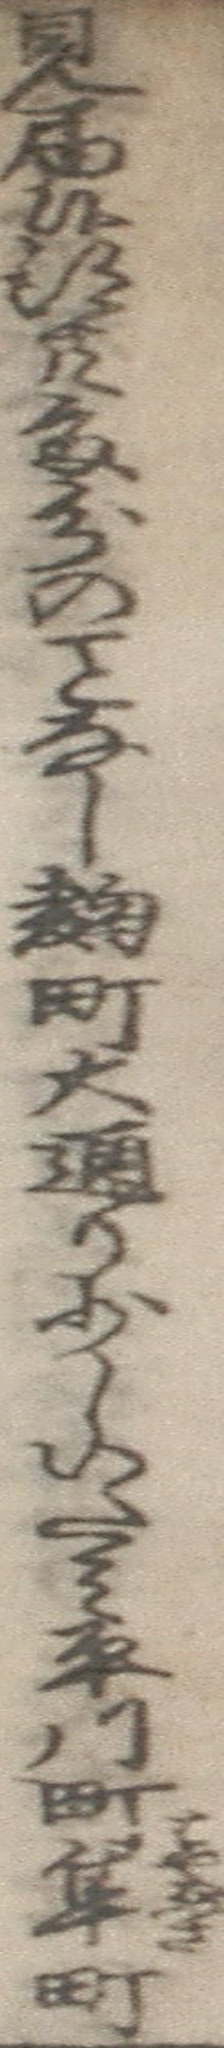見届候得共多分のことなし麹町大通り少しいたみ平川町隼町
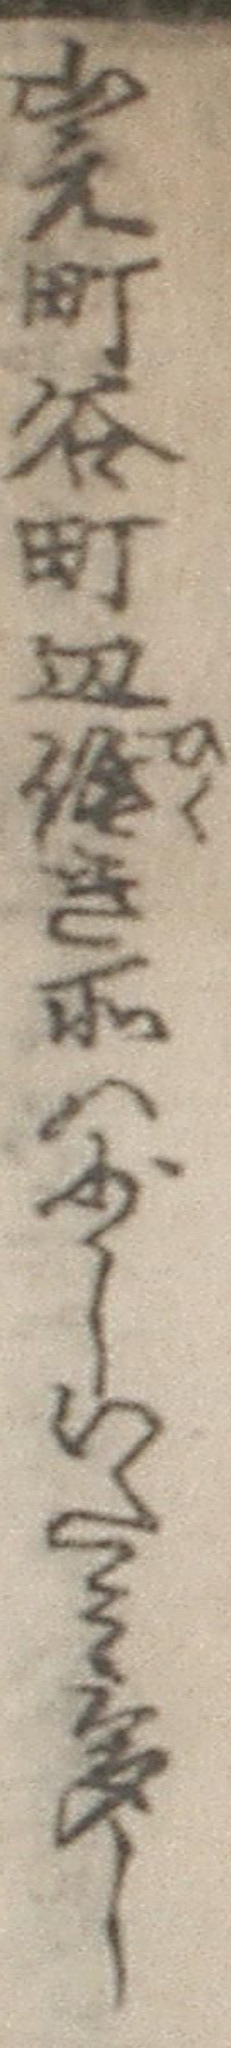山元町谷町辺低き所は少しいたみ多し
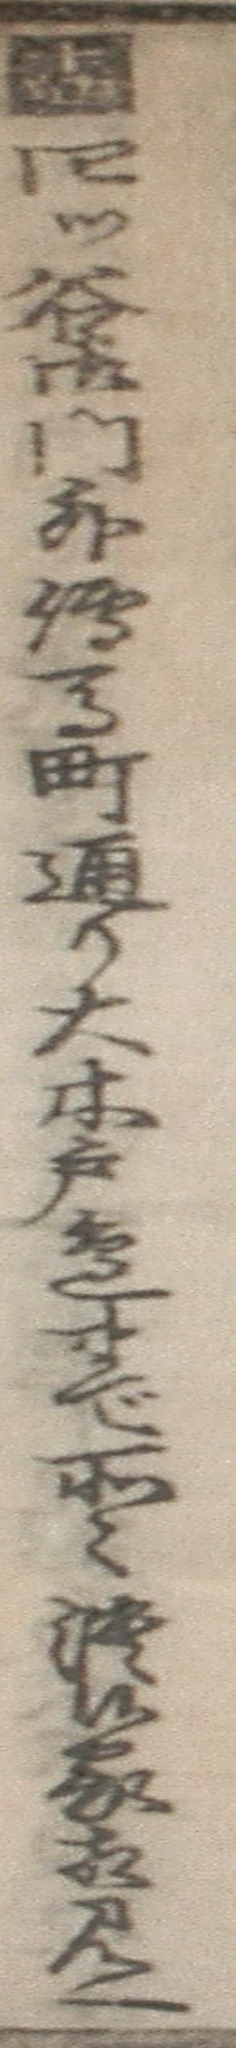十四四ッ谷御門外伝馬丁通り大木戸辺まで所〻潰候家相見へ
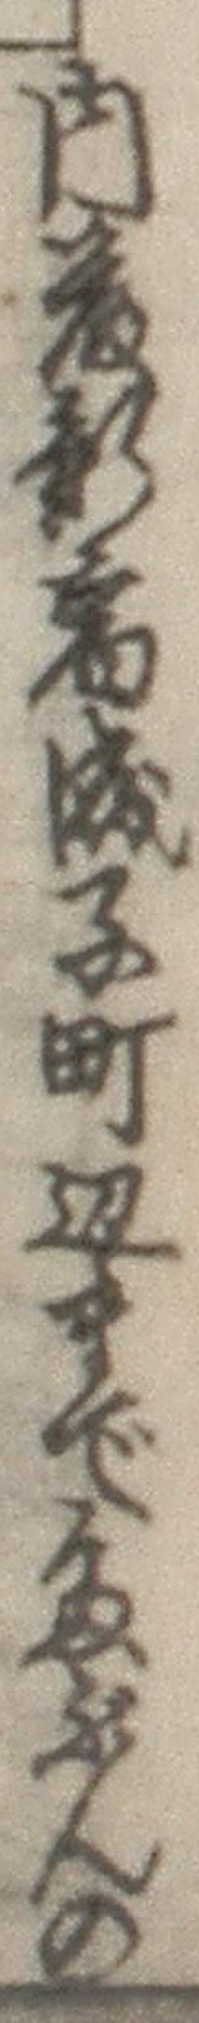内藤新宿成子町辺までたぶんの
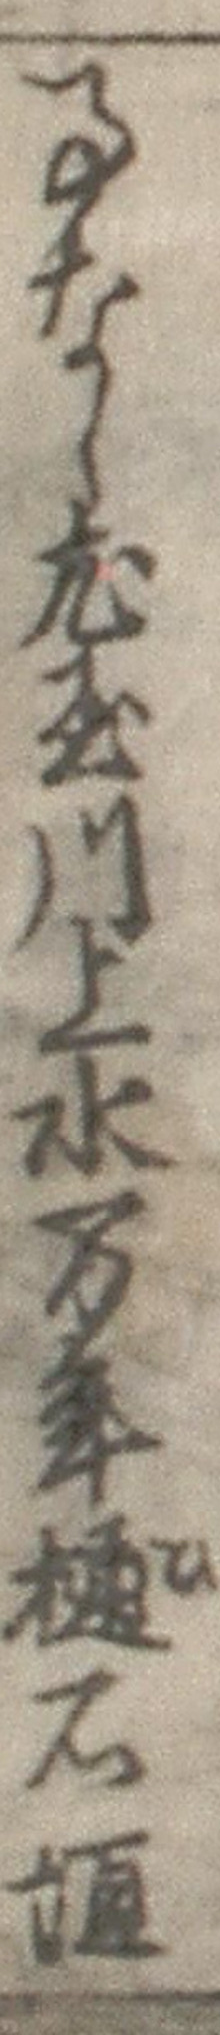事なし尤玉川上水万年樋石垣
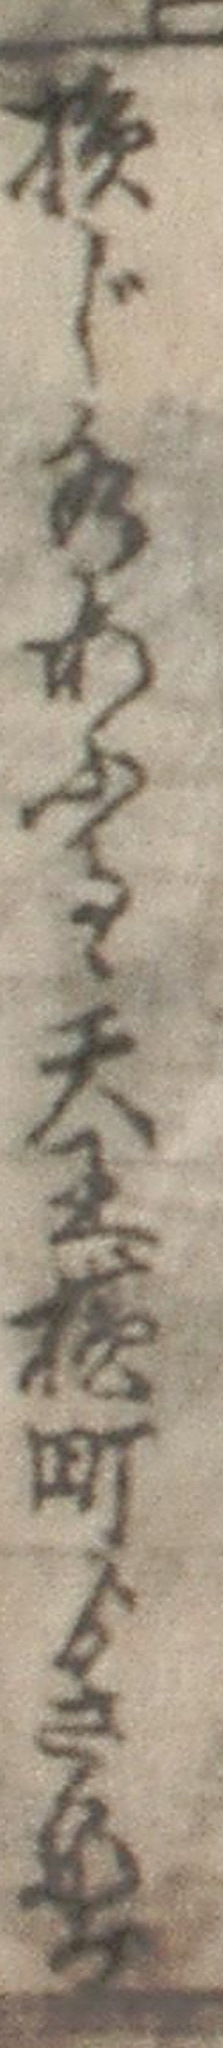損じ水あふるゝ天王横町ゟさめが
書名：江戸大地震末代鑑
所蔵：東京大学地震研究所図書室 Earthquake Research Institute Library, The University of Tokyo, JAPAN
